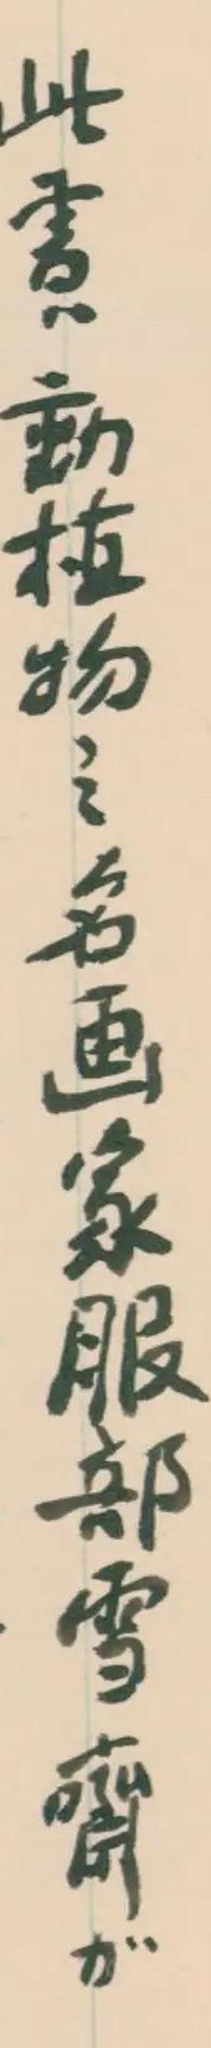此書ハ動植物之名画家服部雪齋ガ
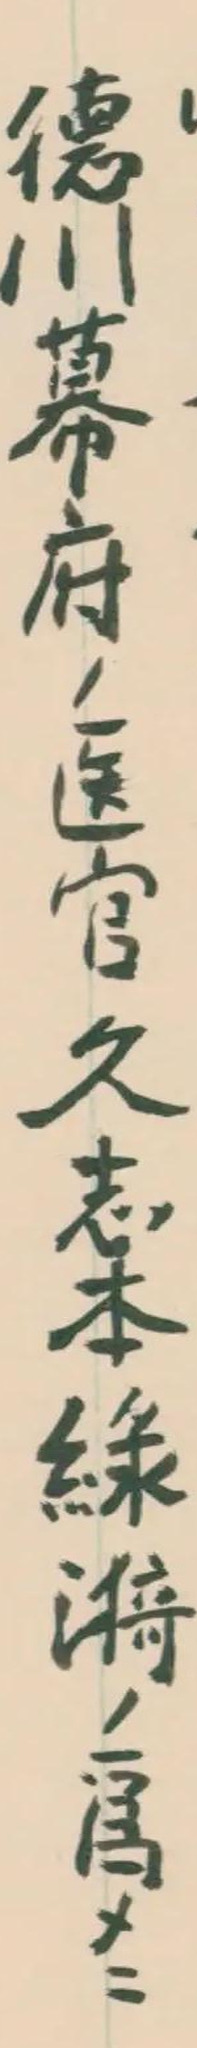徳川幕府ノ医官久志本緑漪ノ為メニ
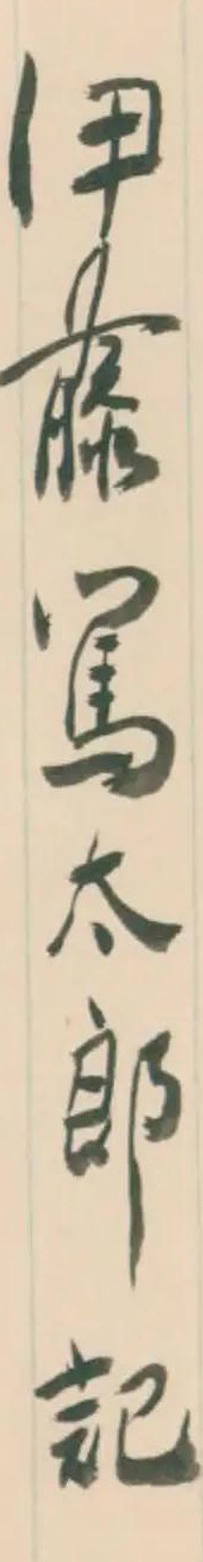伊藤篤太郎記
